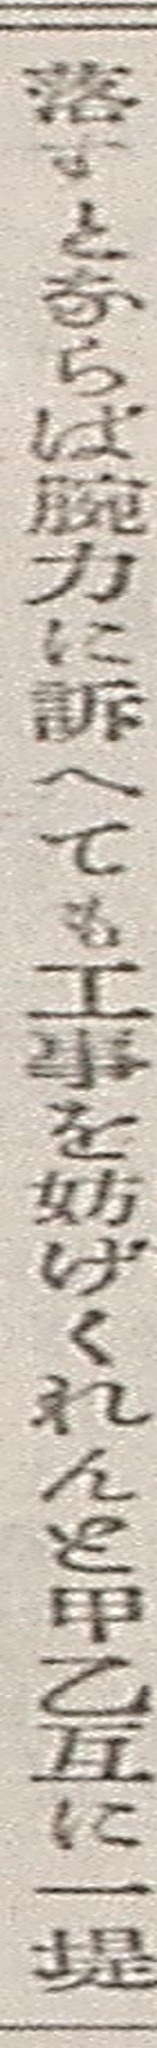落すとならば腕力に訴へても工事を妨げくれんと甲乙互に一堤
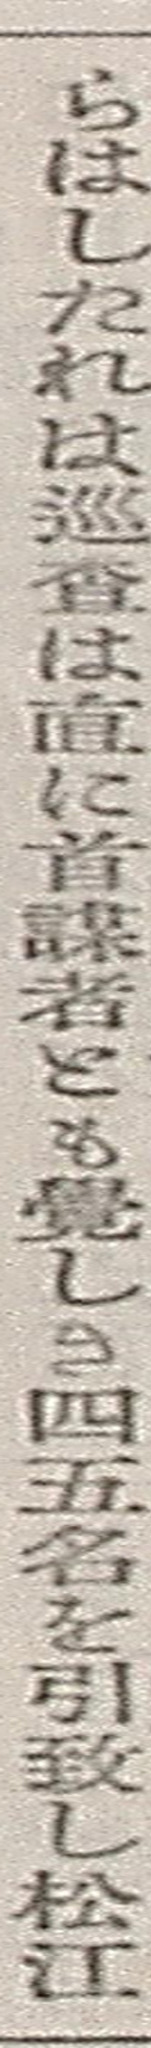らはしたれは巡査は直に首謀者とも覚しき四五名を引致し松江
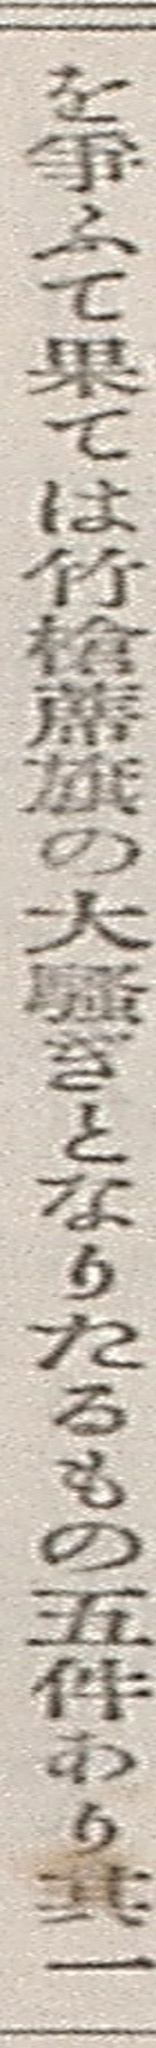を争ふて果ては竹槍蓆旗の大騒ぎとなりたるもの五件あり其一
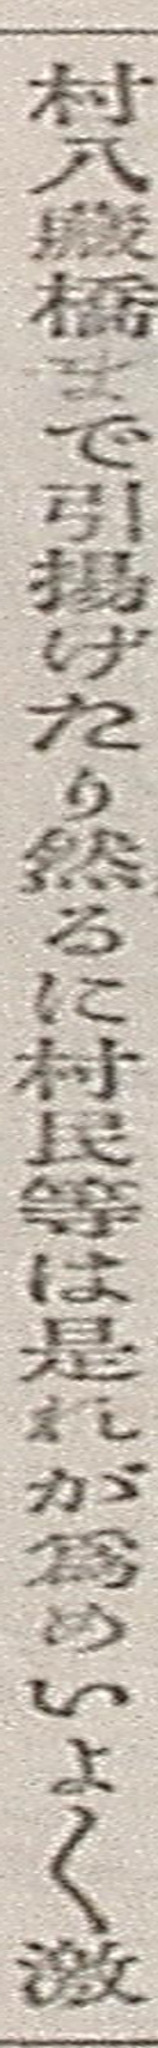村八藏橋まで引揚げたり然るに村民等は是れが為めいよ〳〵激
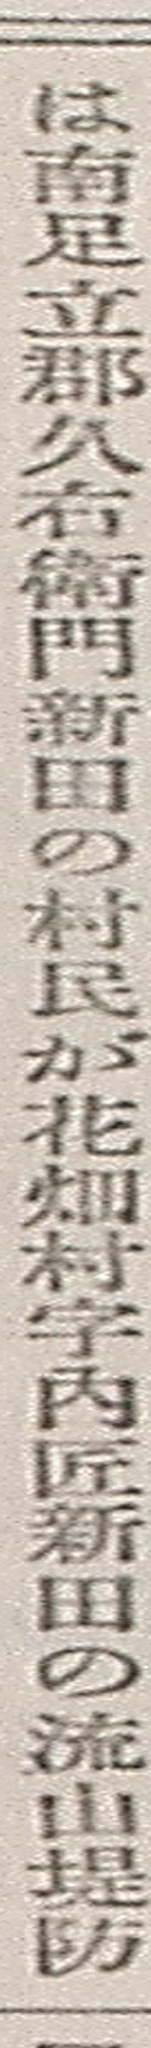は南足立郡久右衛門新田の村民が花畑村字内匠新田の流山堤防
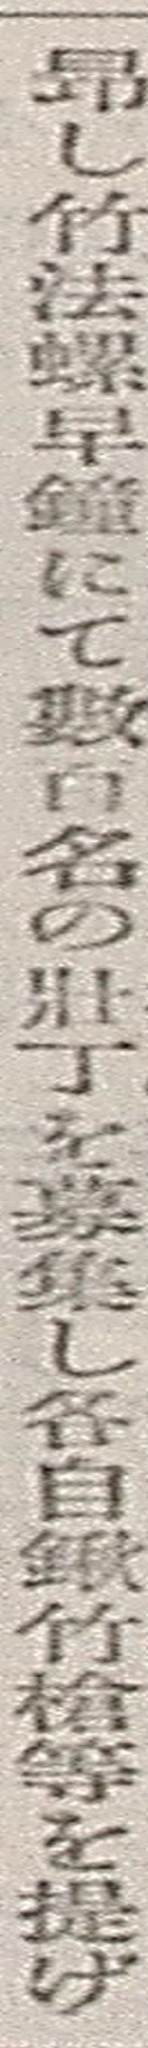昂し竹法螺早鐘にて数百名の壮丁を募集し各自鍬竹槍等を提げ
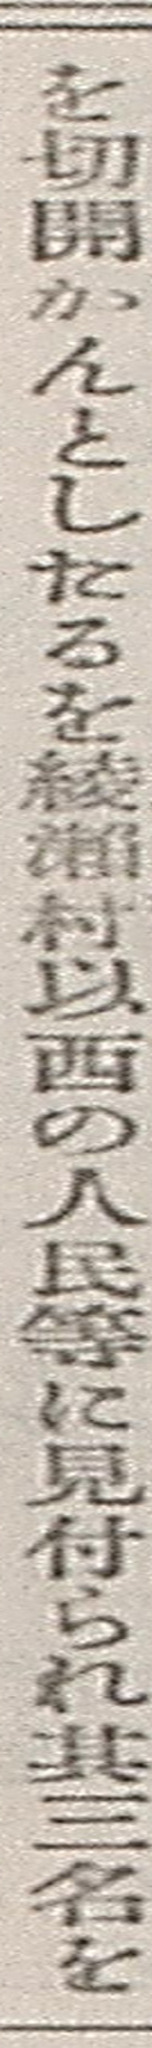を切開かんとしたるを綾瀬村以西の人民等に見付られ其三名を
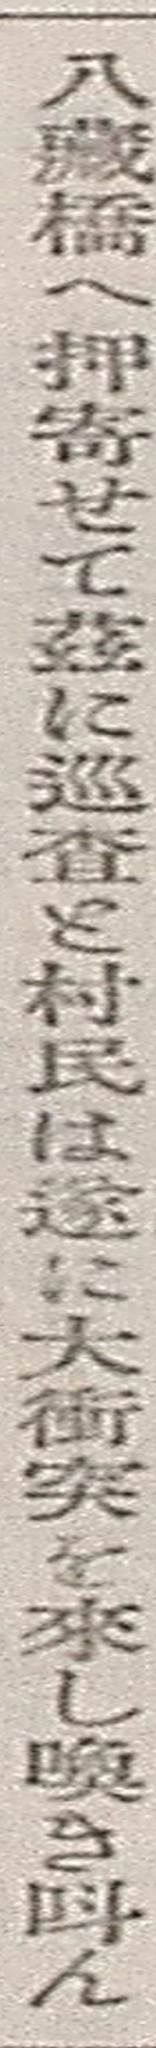八藏橋へ押寄せて茲に巡査と村民は遂に大衝突を来し喚き叫ん
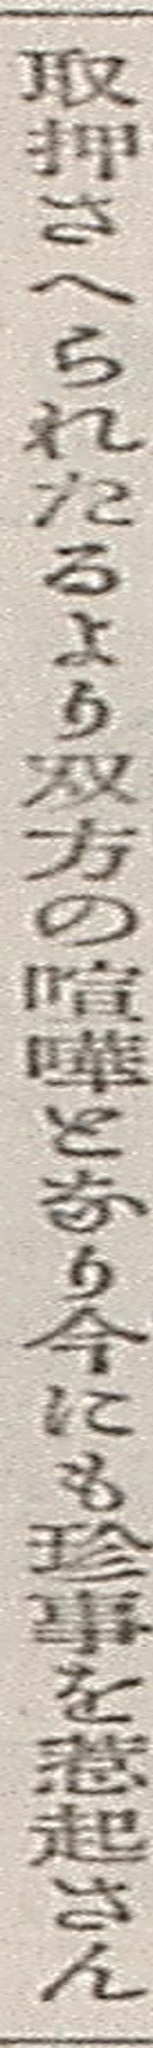取押さへられたるより双方の喧嘩となり今にも珍事を惹起さん
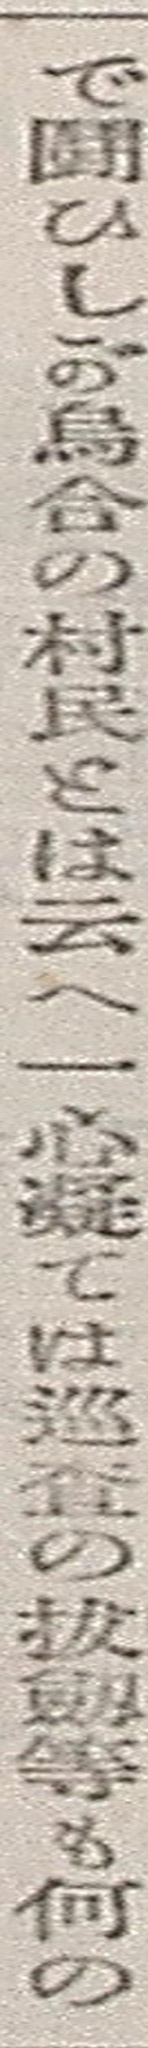で闘ひしが烏合の村民とは云へ一心凝ては巡査の抜釼等も何の
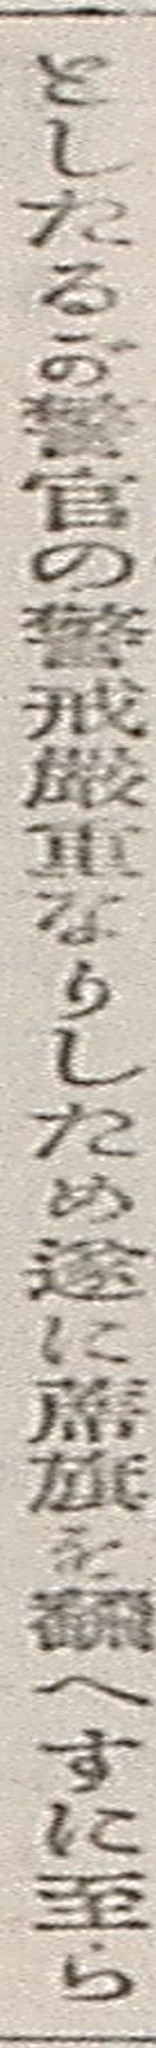としたるが警官の警戒厳重なりしため遂に蓆旗を翻へすに至ら
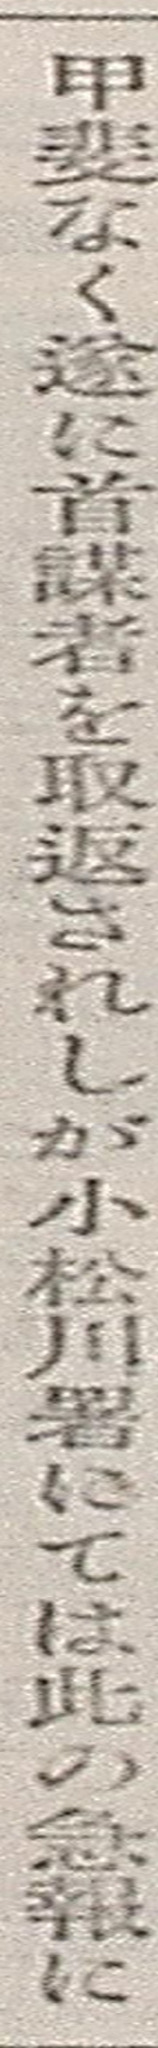甲斐なく遂に首謀者を取返されしが小松川署にては此の急報に
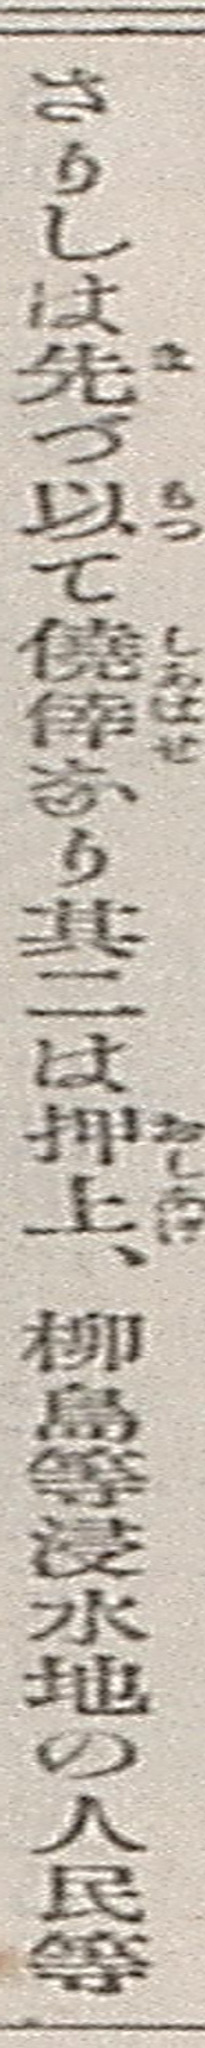さりしは先づ以て僥倖なり其ニは押上、柳島等浸水地の人民等
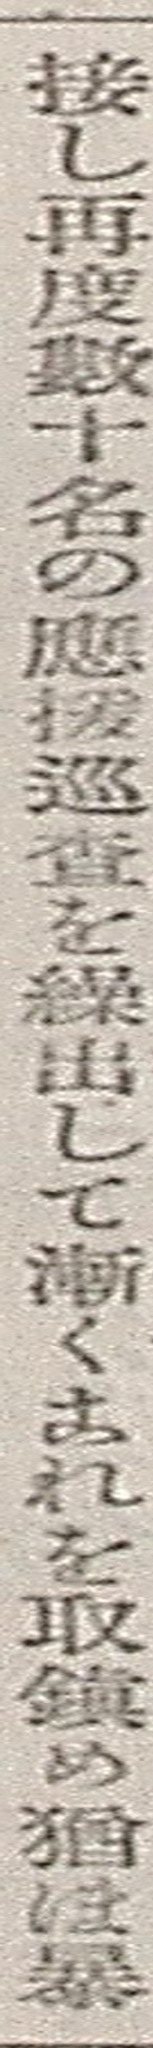接し再度数十名の応援巡査を操出して漸くこれを取鎮め猶ほ暴
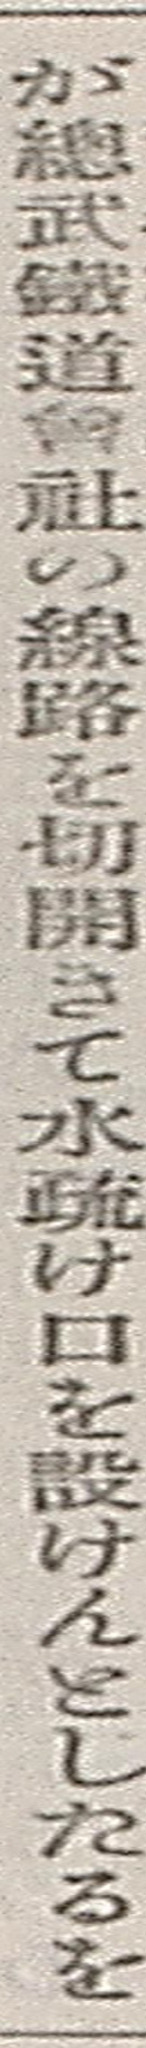が総武鉄道会社の線路を切開きて水疏け口を設けんとしたるを
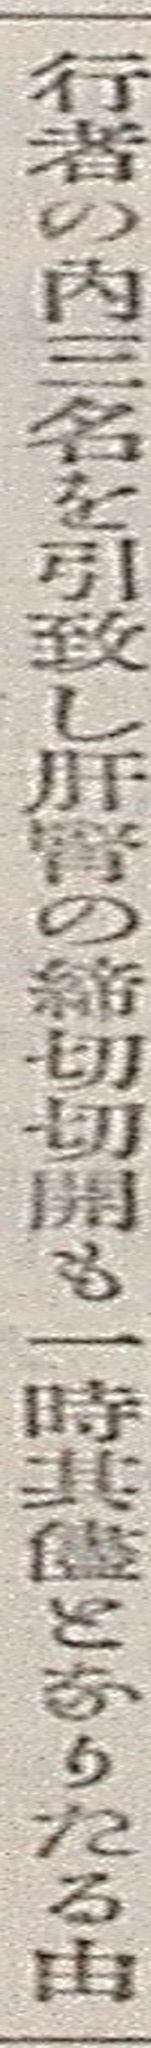行者の内三名を引致し肝腎の締切切開も一時其侭となりたる由
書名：風俗畫報臨時増刊第百二十四號　洪水地震被害録（上）
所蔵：東京大学地震研究所図書室 Earthquake Research Institute Library, The University of Tokyo, JAPAN
